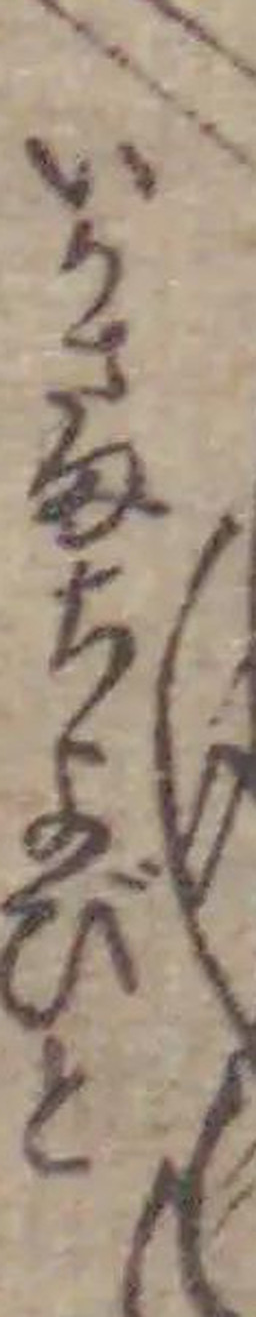いかさまちよびと

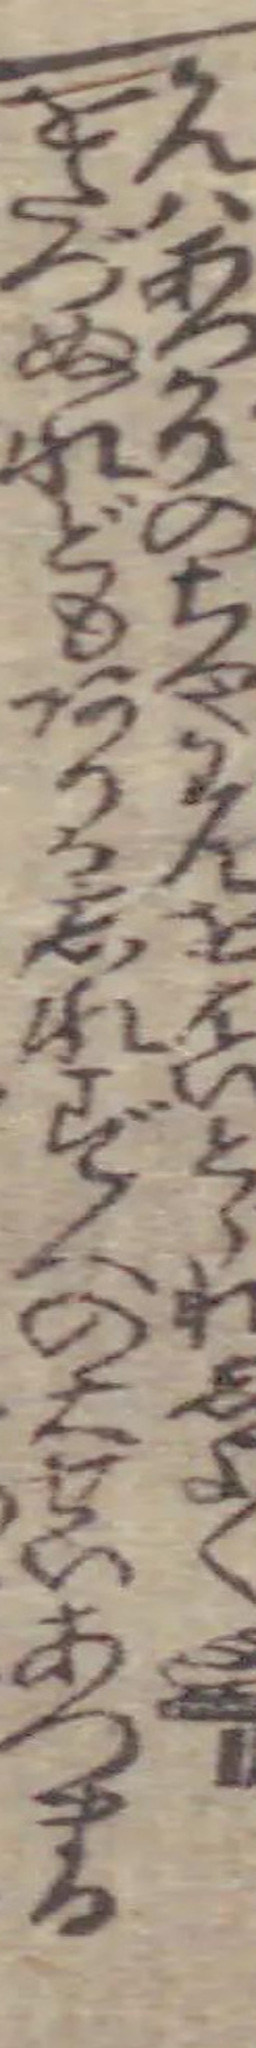をたづぬれどもありかしれず人の大せいあつまる
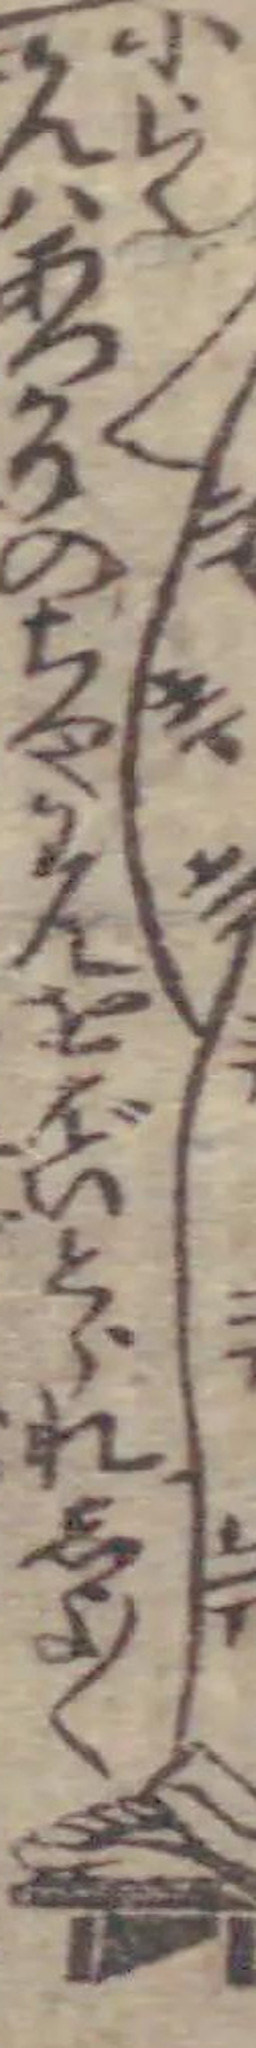がんはあつかりのちやわんをばいとられしよ〳〵
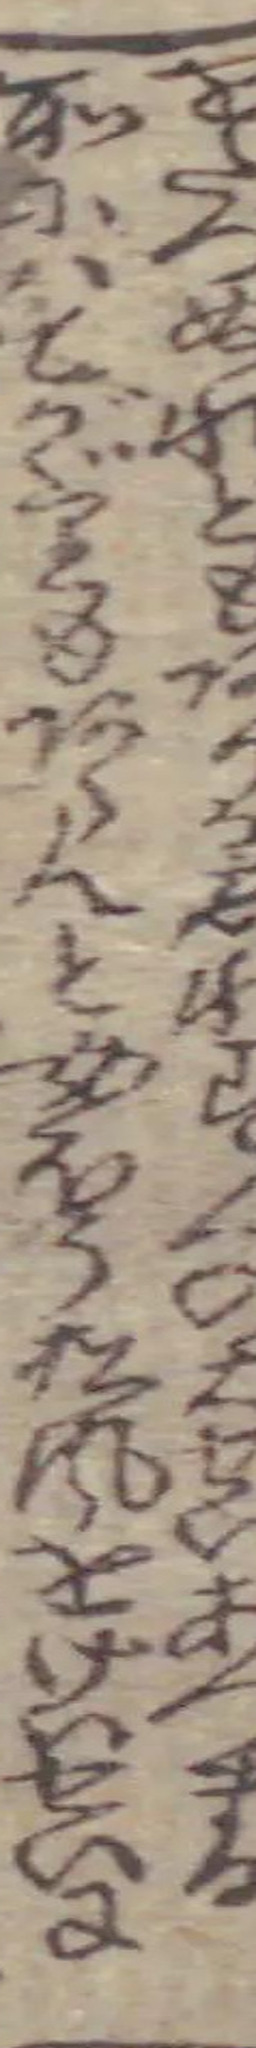所にはてがゞりもあらんと女ほう松風をけいせいに
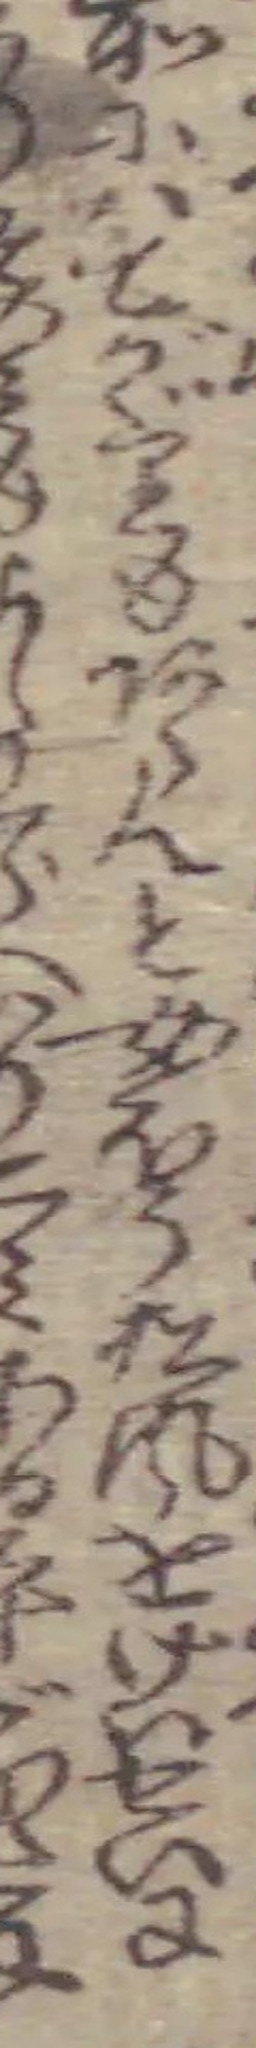うりそのみもよしわらへいりこみある平がかたに
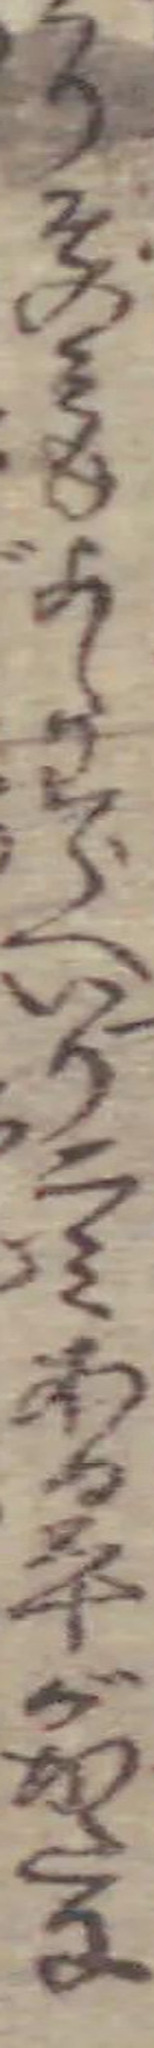うりそのみもよしわらへいりこみある平がかたに
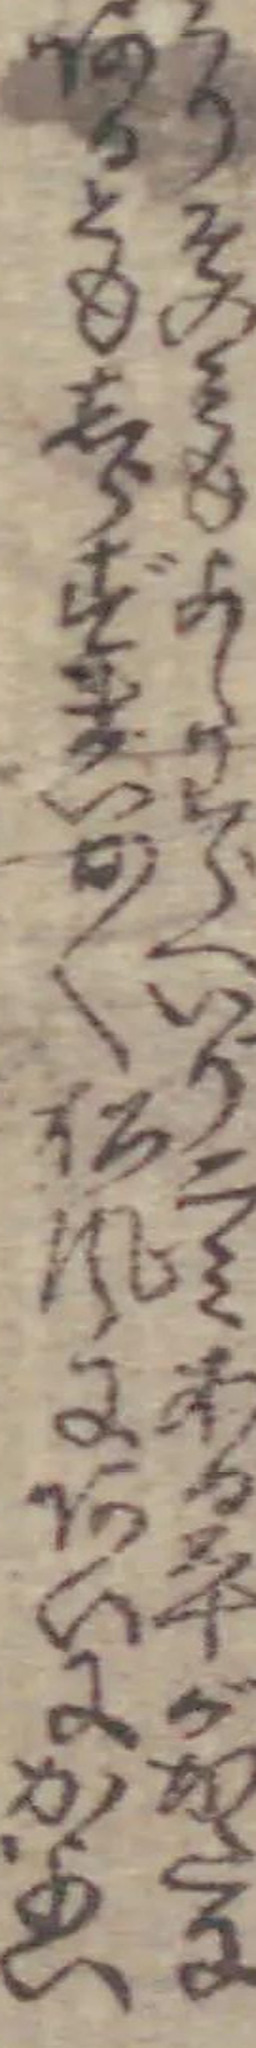あるともしらずまい日〳〵松風にあいにかよいけり
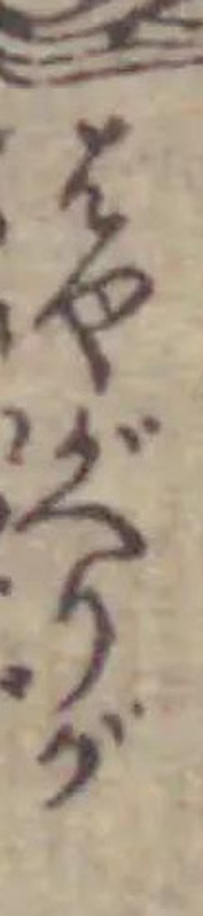はやがえりが
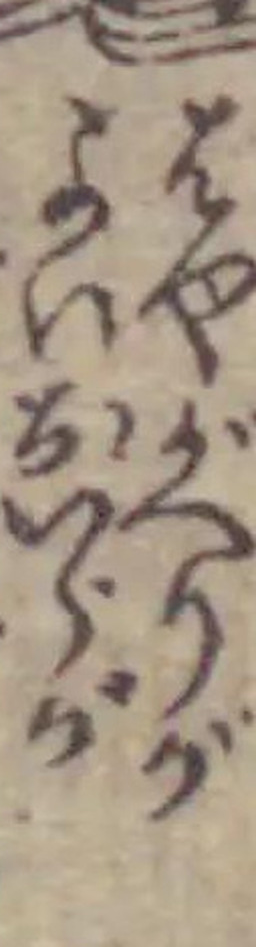よいおいらが
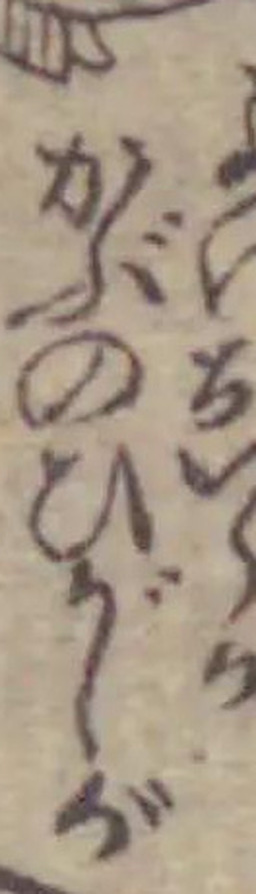かぶのひがしが
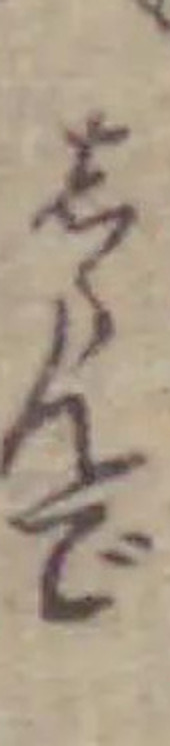しらんで
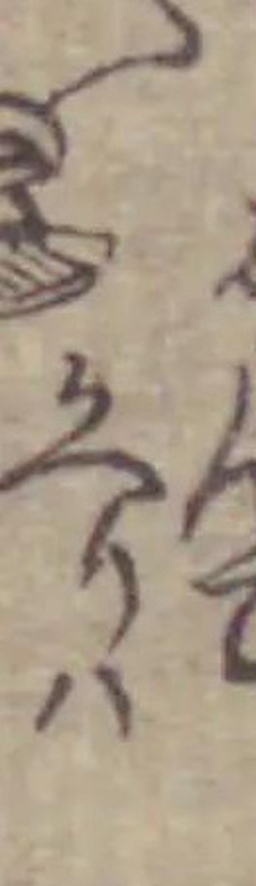かへりは
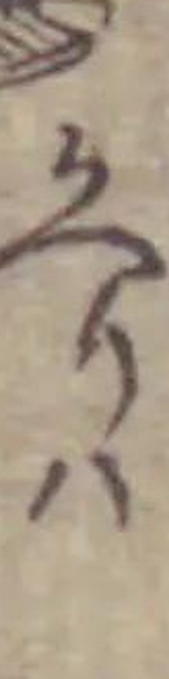かへりは
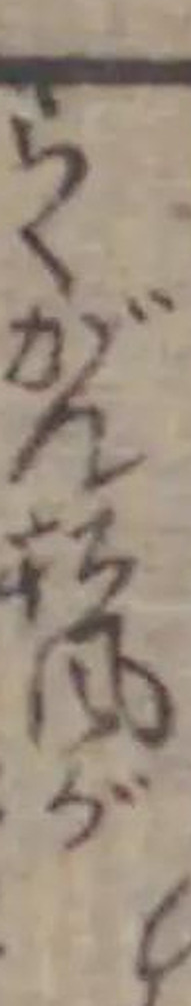らくがん松風が
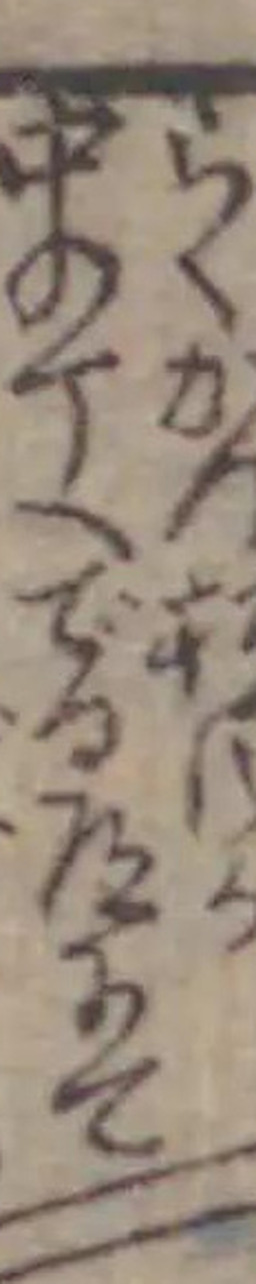中の丁へでる道にて
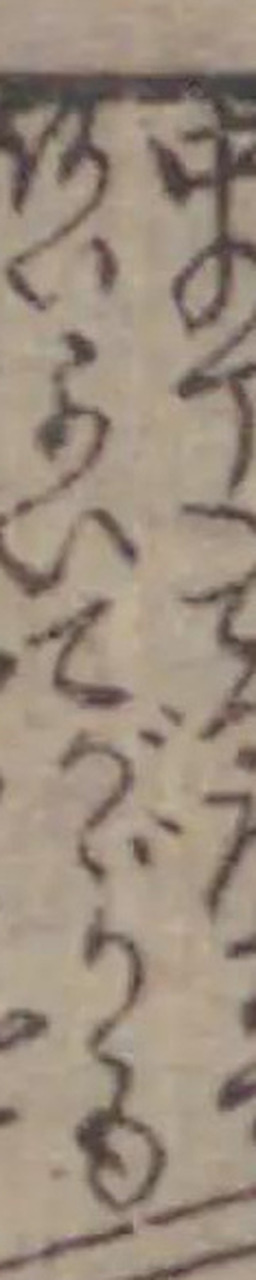あいよいてがゝりも
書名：名代干菓子山殿 3巻
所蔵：国立国会図書館 National Diet Library, JAPAN
